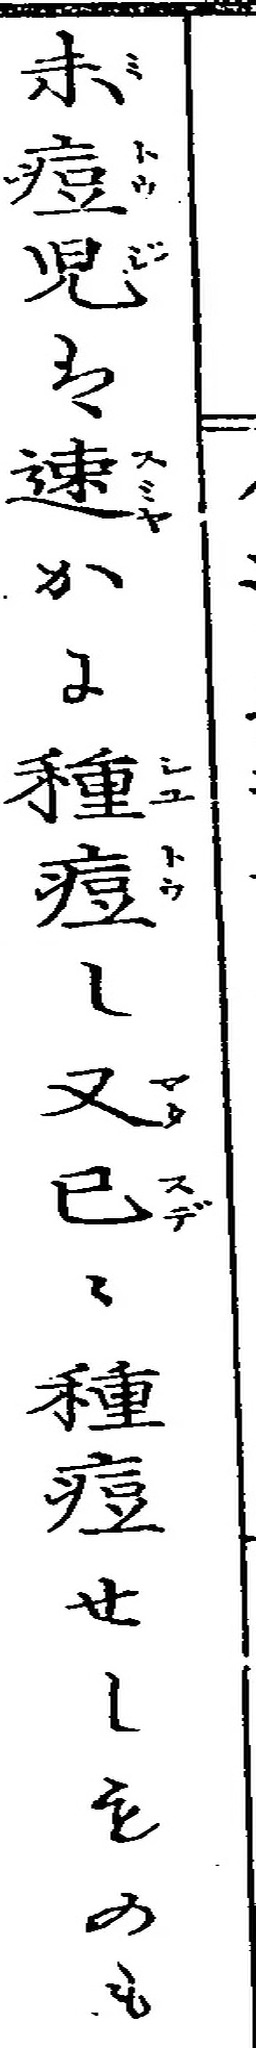未痘児は速かに種痘し又已に種痘せしものも
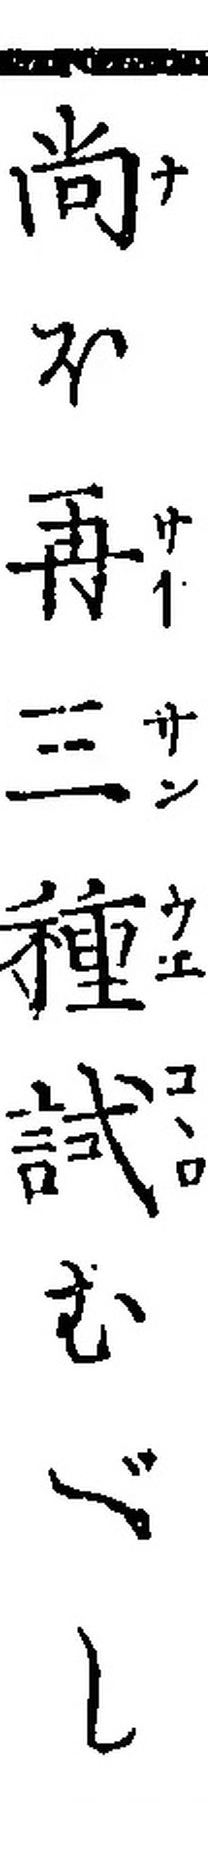尚ほ再三種試むべし
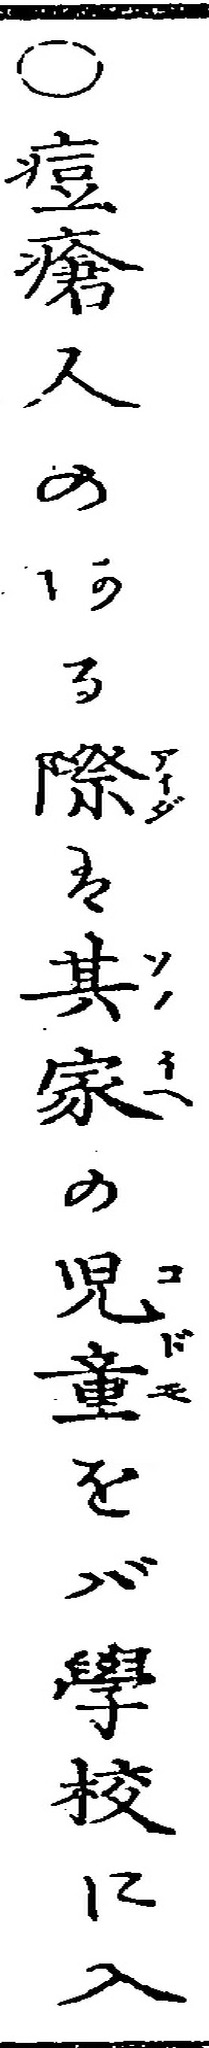○痘瘡人のある際は其家の児童をば学校に入
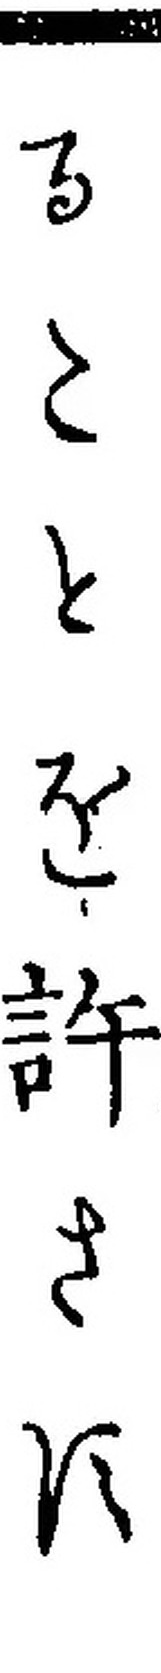ることを許さす
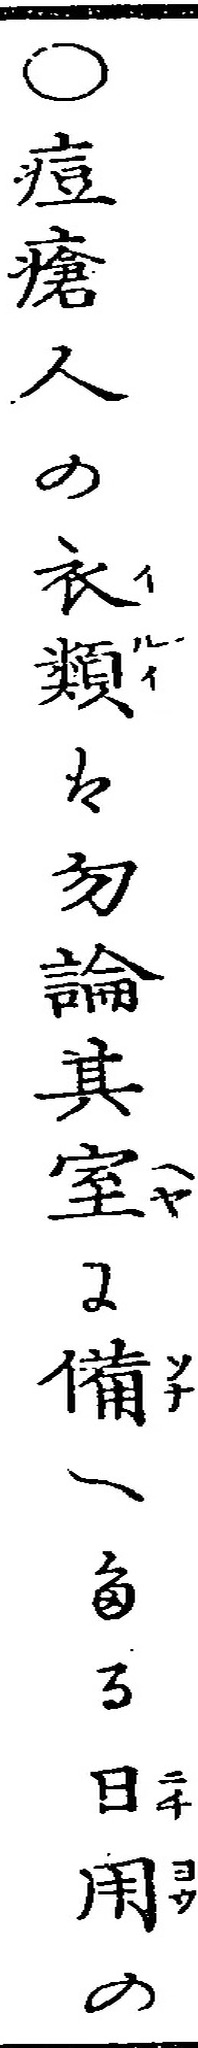○痘瘡人の衣類は勿論其室に備へたる日用の
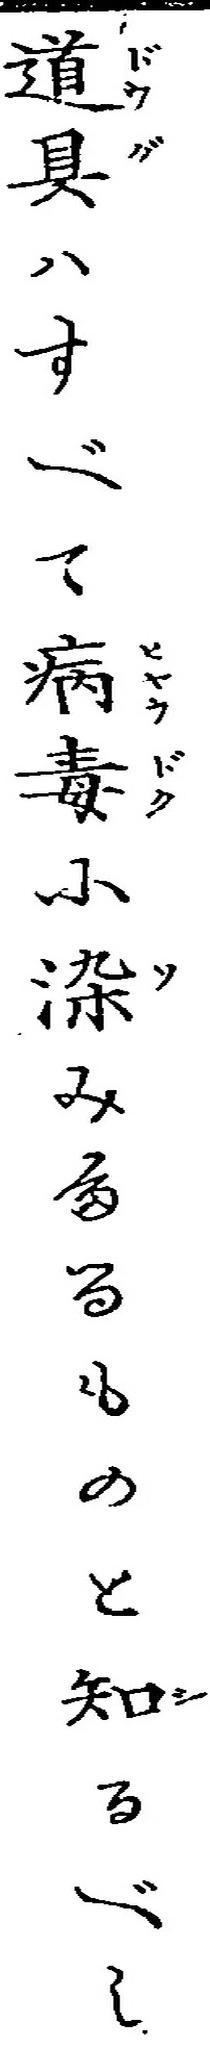道具はすべて病毒に染みたるものと知るべし
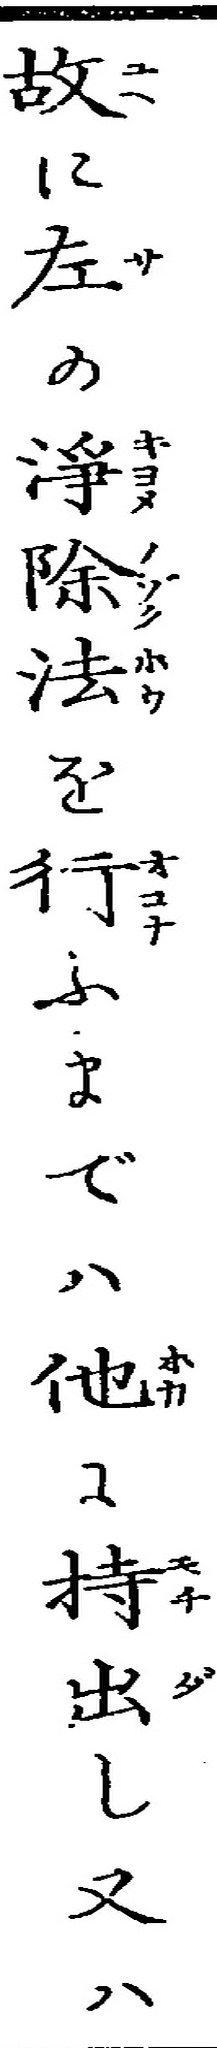故に左の浄除法を行ふまでは他に持出し又は
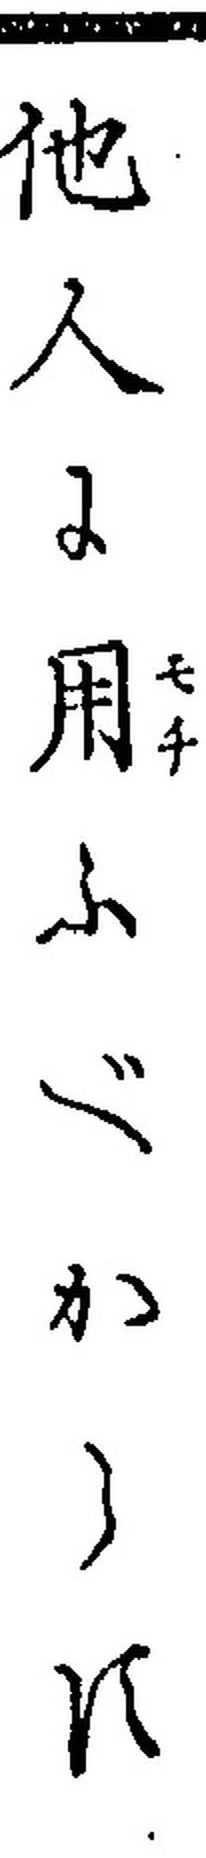他人に用ふべからす
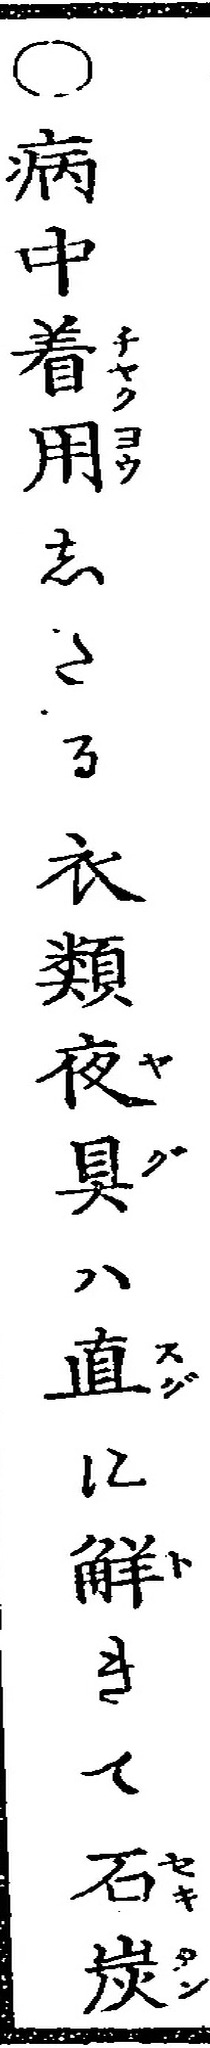○病中着用したる衣類夜具は直に解きて石炭
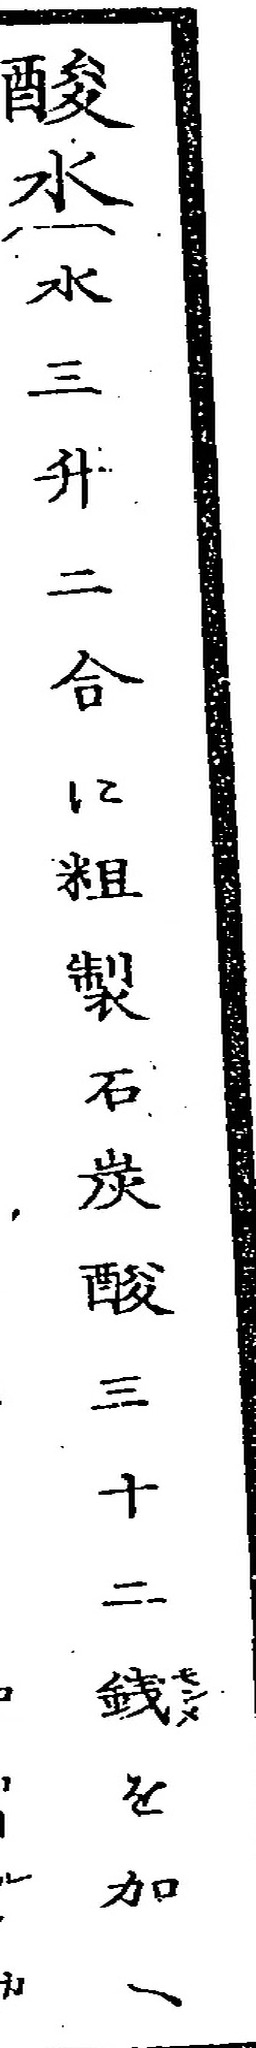酸水[水三升二合に粗製石炭酸三十二銭を加へ
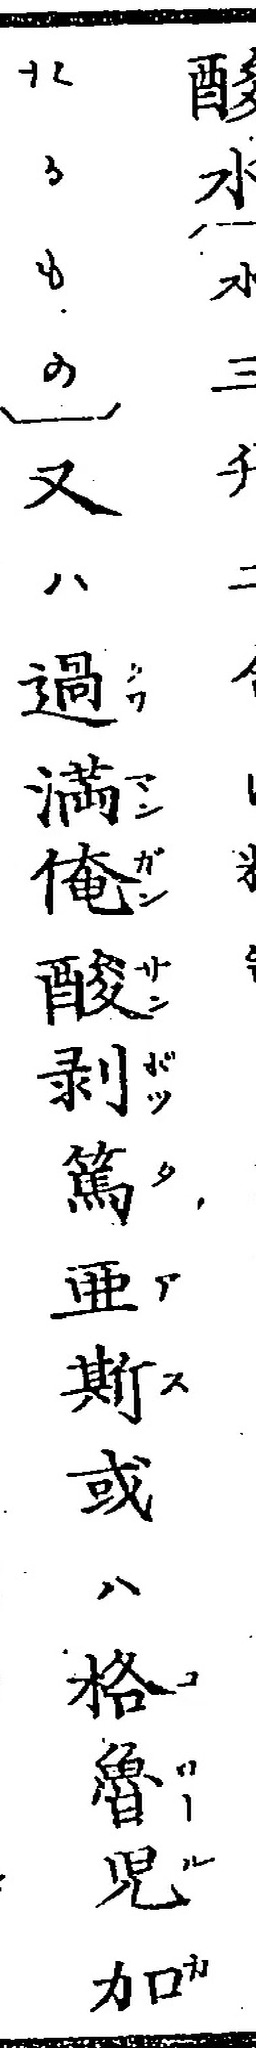たるもの]又は過満俺酸剥篤亜斯或は格魯児加
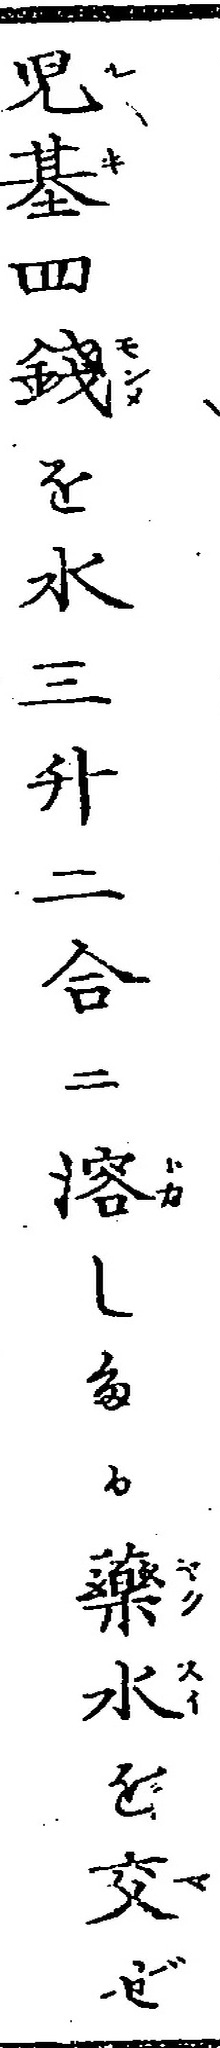児基四銭を水三升二合に溶したる薬水を交ぜ
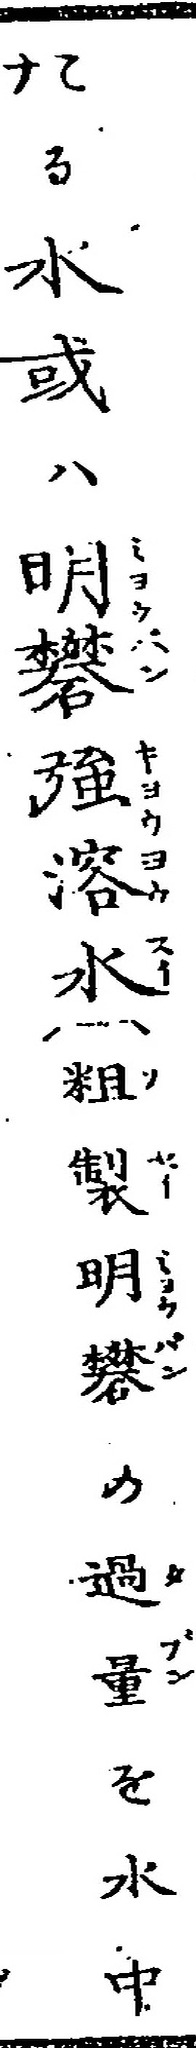たる水或は明礬強溶水[粗製明礬の過量を水中
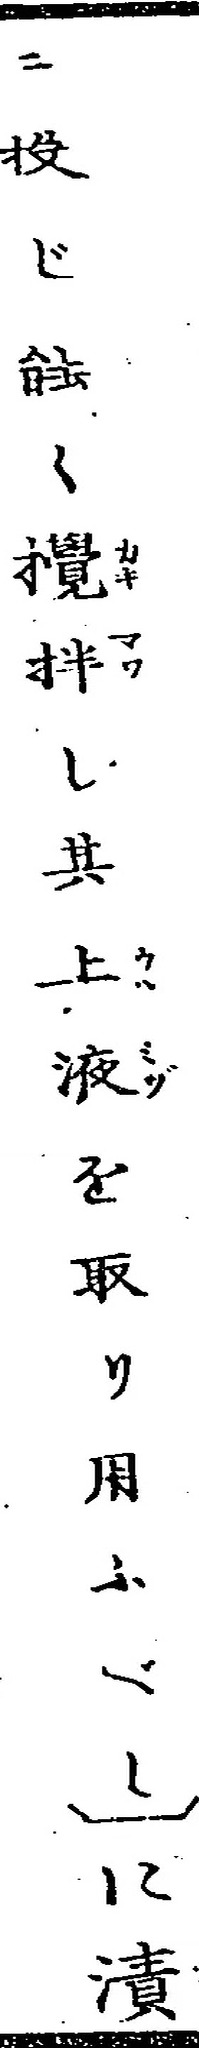に投じ能く攪拌し其上液を取り用ふべし]に漬
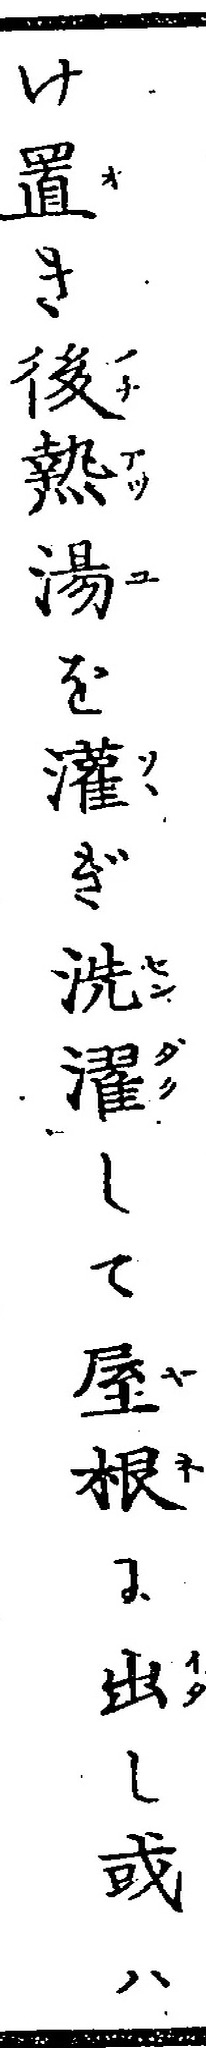け置き後熱湯を灌ぎ洗濯して屋根に出し或は
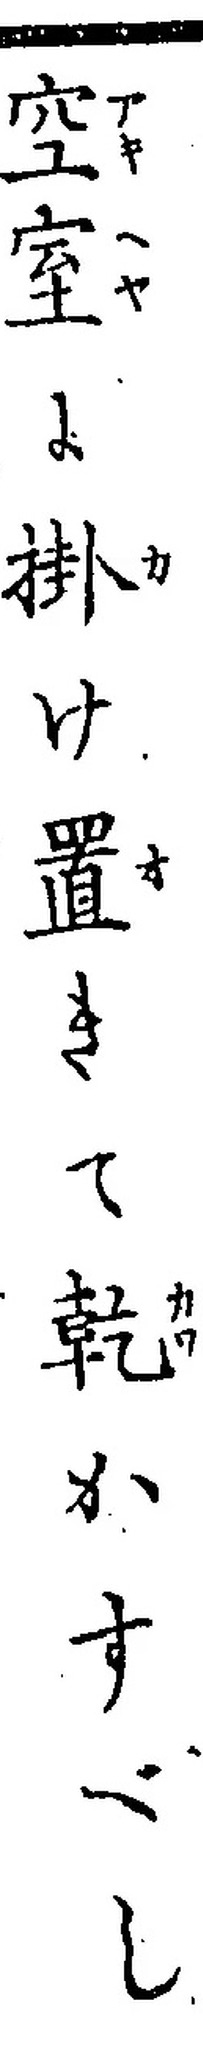空室に掛け置きて乾かすべし
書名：伝染病予防法
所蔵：国立国会図書館 National Diet Library, JAPAN
